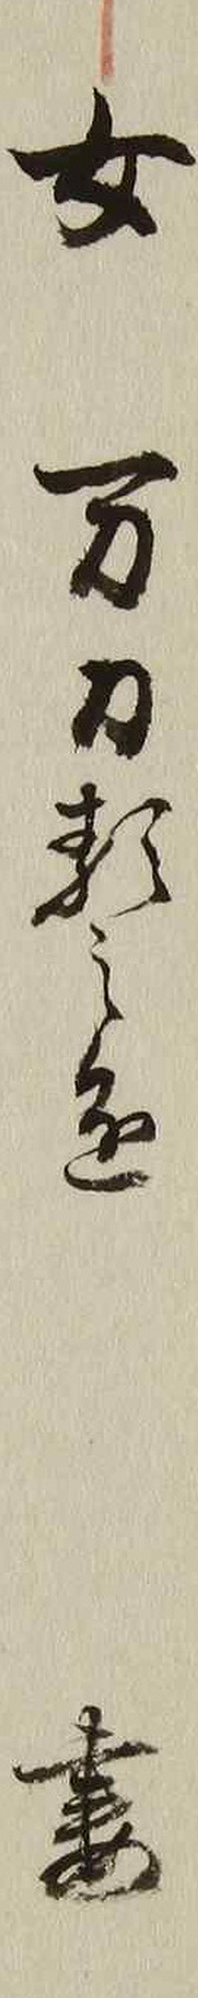女万刀類之進妻
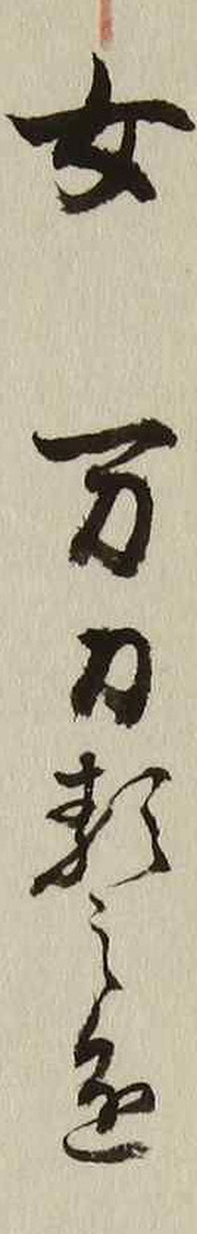女万刀類之進妻
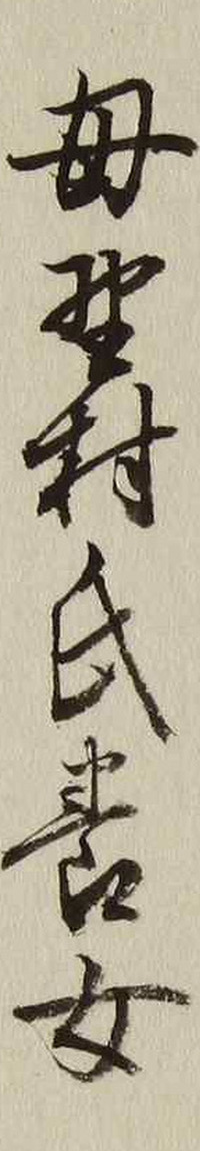母野村氏養女
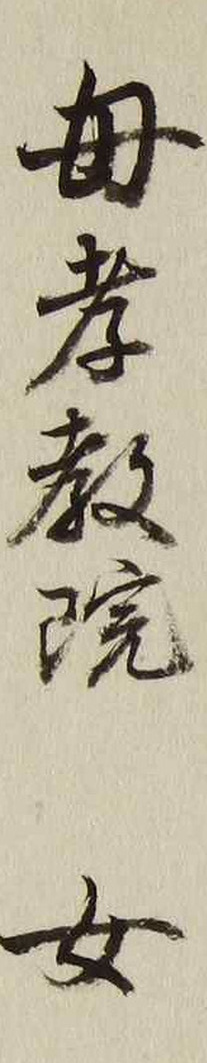母孝教院女

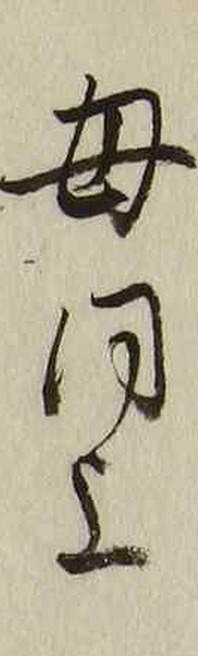母同上
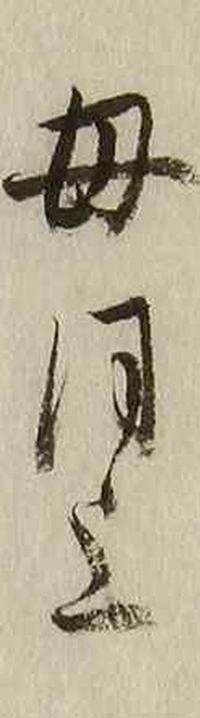母同上
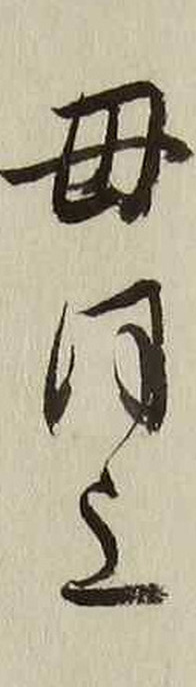母同上
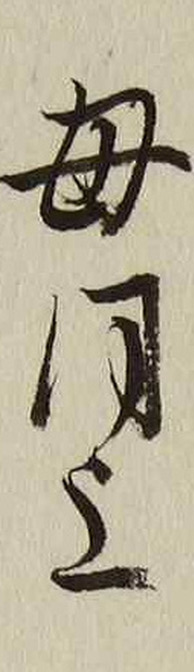母同上
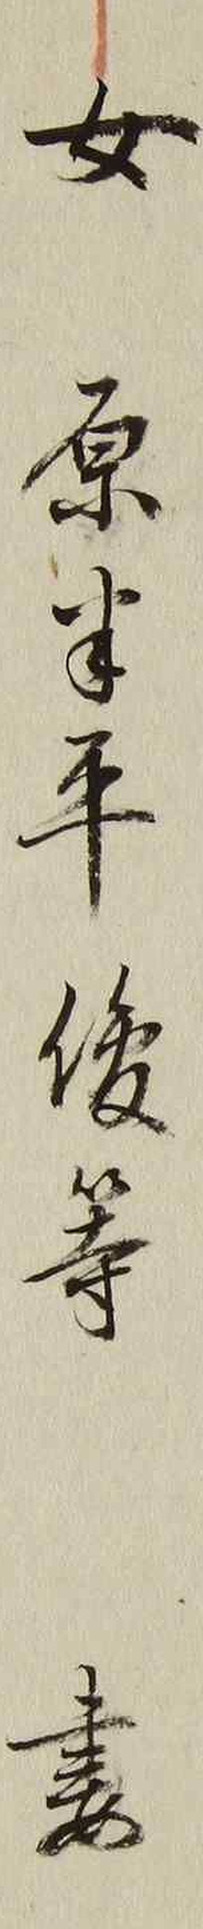女原半平俊等妻
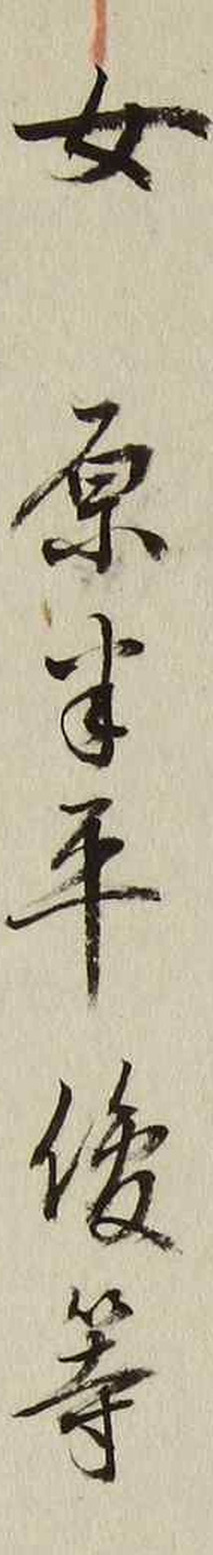女原半平俊等妻
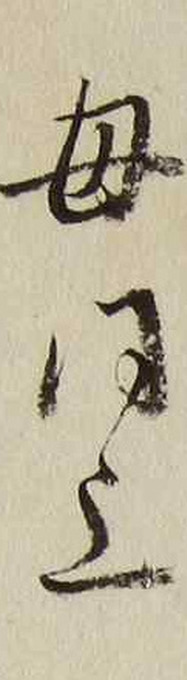母同上

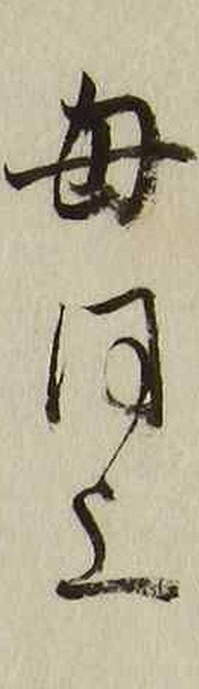母同上
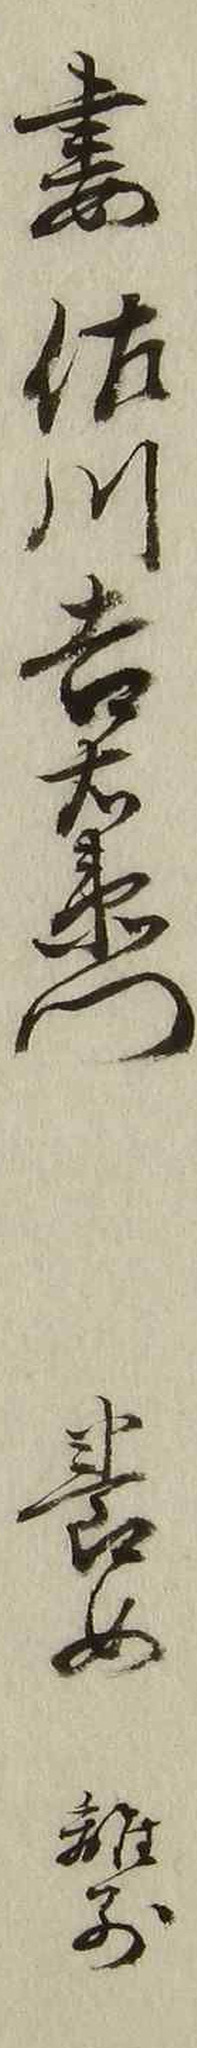妻佐川吉右衛門養女離別
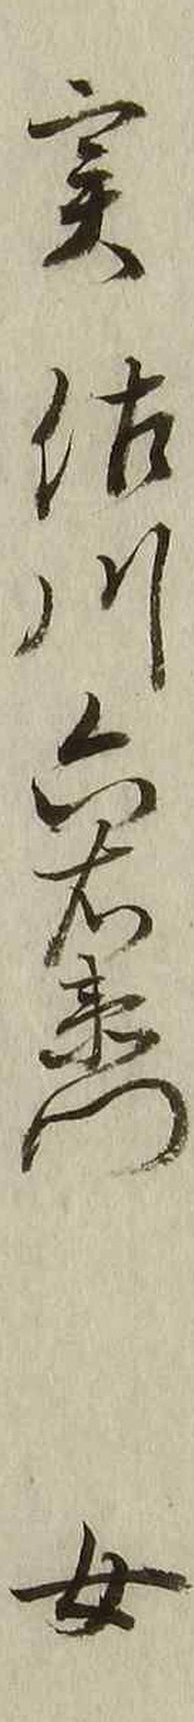実佐川六右衛門女
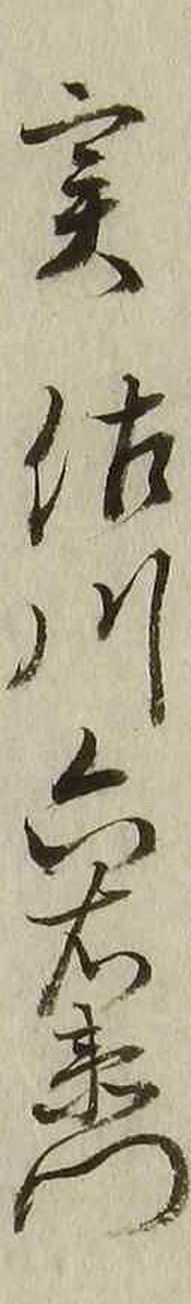実佐川六右衛門女
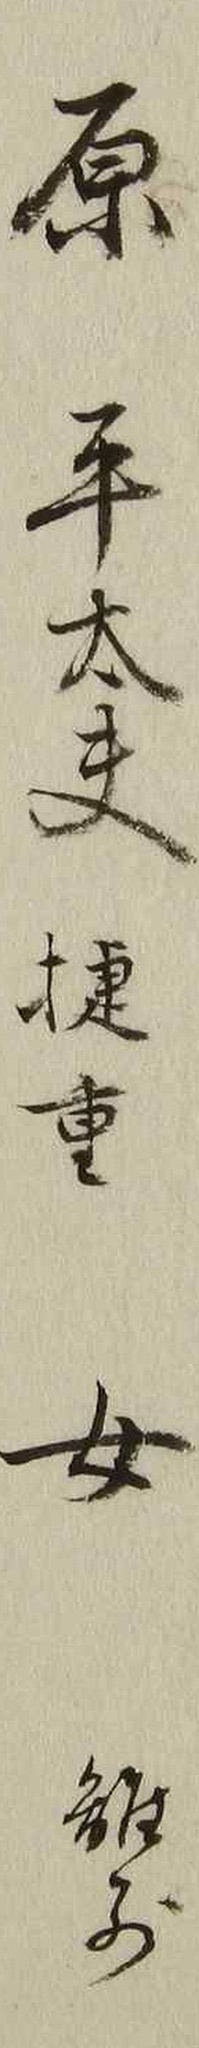原平太夫捷重女離別
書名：諸士系譜　巻之39　は之部7
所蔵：会津若松市立会津図書館
